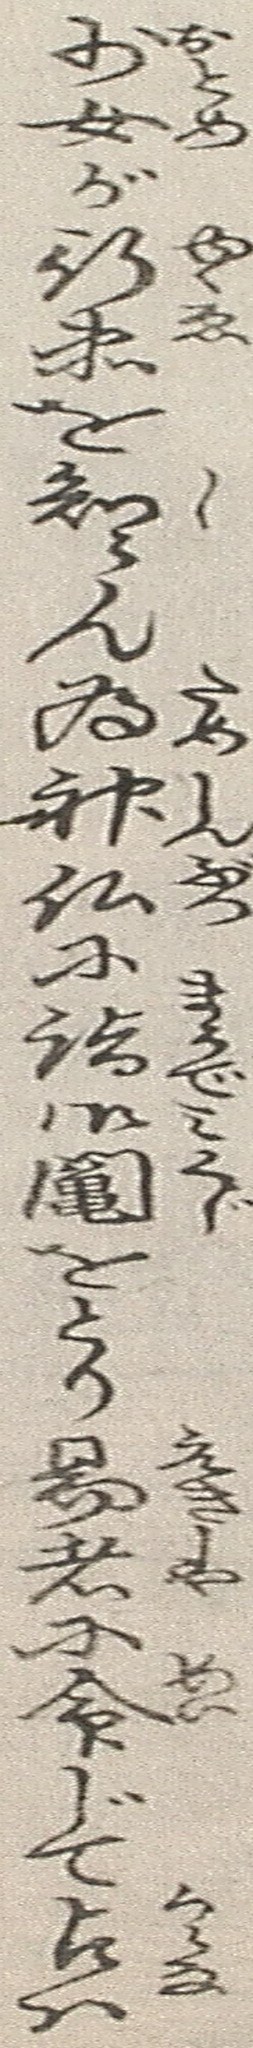少女が行衛を知らん為神仏に詣御御鬮をとり易者に命じて占ハ
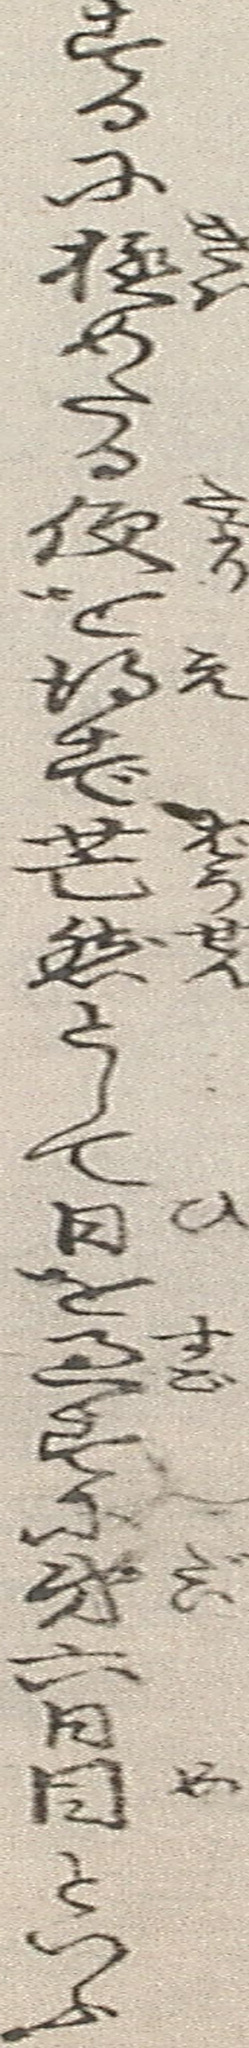するに極めたる便を得ず茫然として日を過すに第六日目といふ
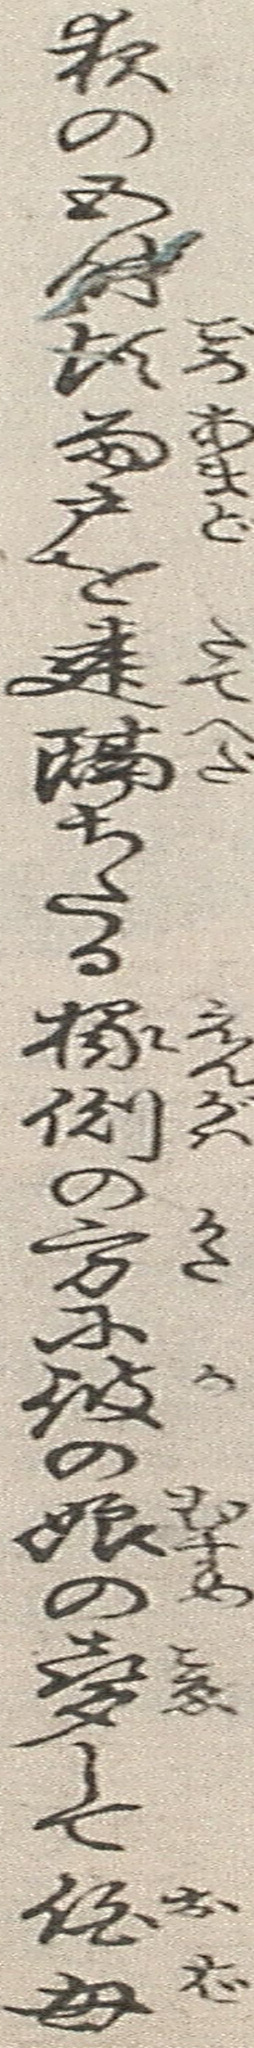夜の五時頃雨戸を建隔ちたる縁側の方に彼の娘の声して叔母
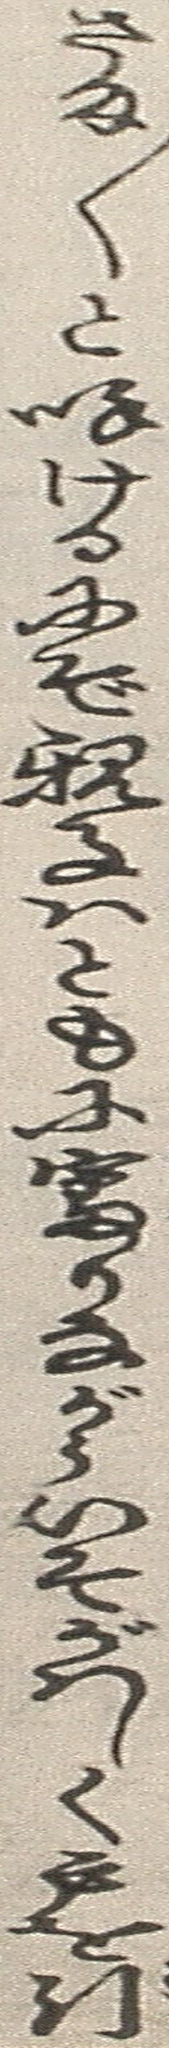さま〳〵と呼けるにぞ親子ハともに審りながらいそがハしく戸を引
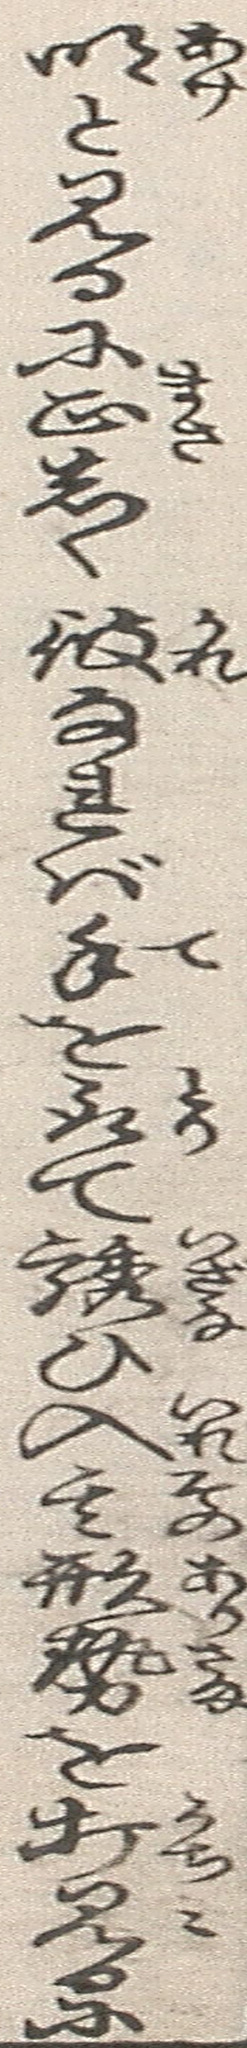明と見るに正しく彼なれバ手を取て誘ひ入其形勢を打見るに
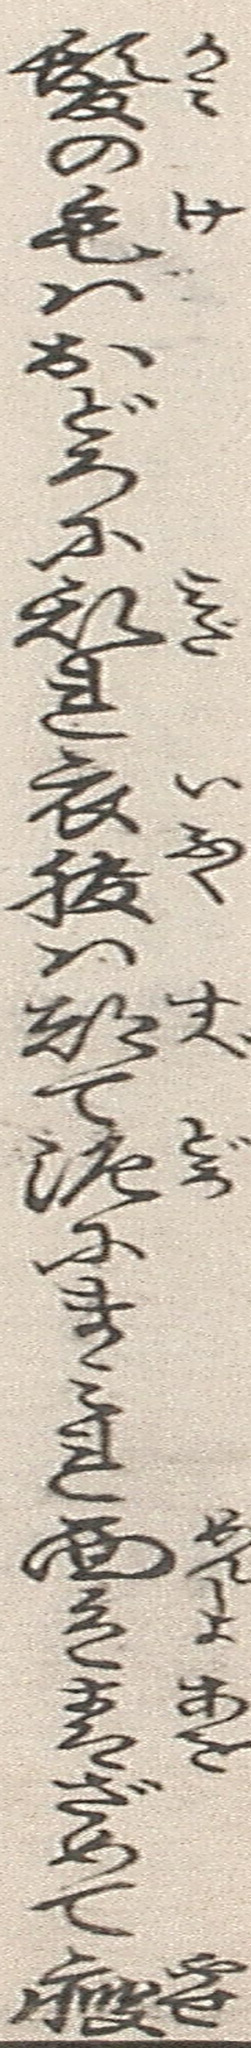髪の毛ハおどろに乱れ衣服ハ都て泥にまミれ面色青ざめて痩
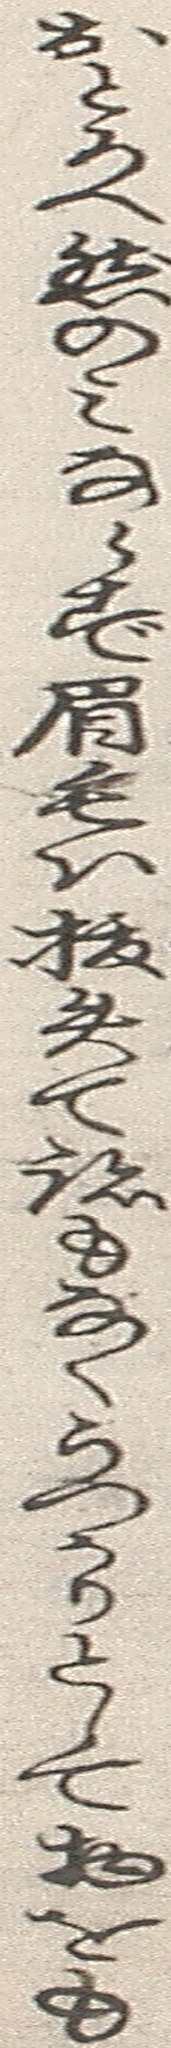おとろへ然のミならず眉毛ハ抜失て跡もなくうつかりとして物をも
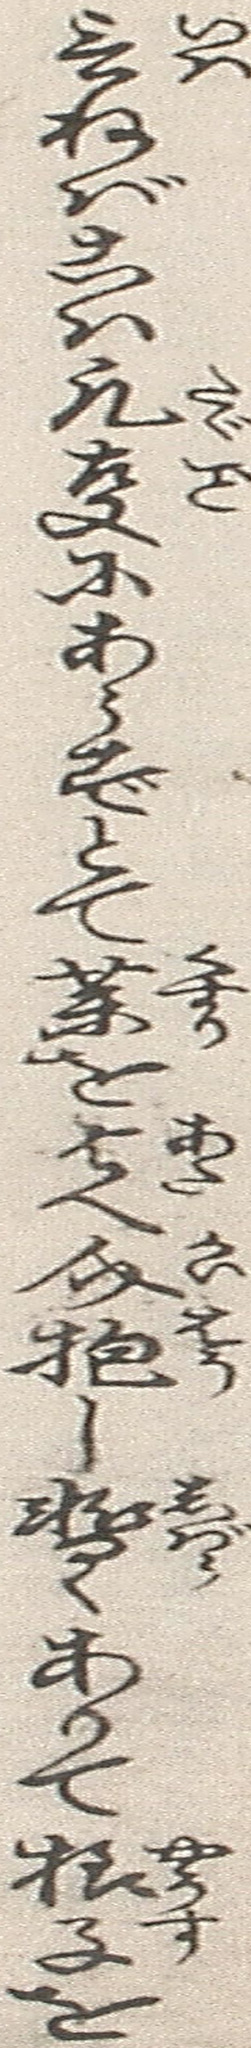言ねバこハ凡事にあらずとて薬を与へ介抱し暫くありて様子を
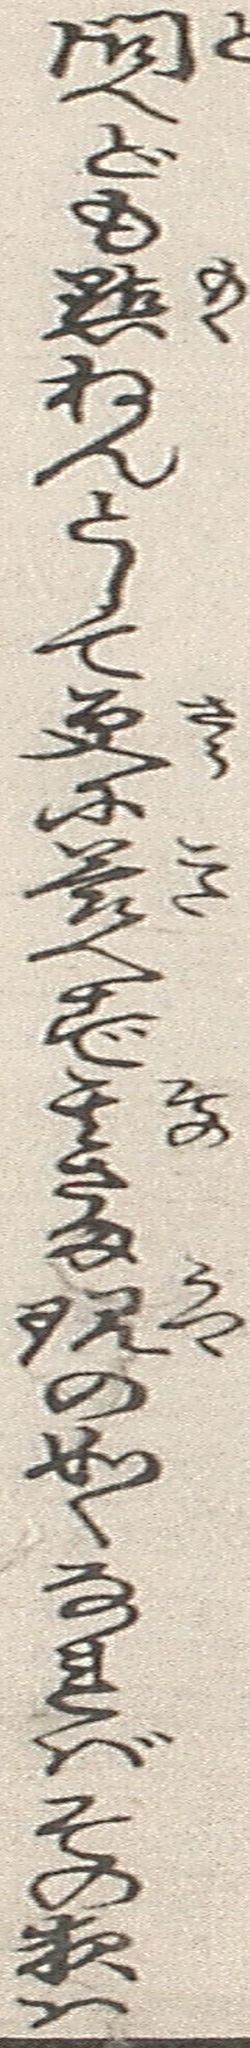問へども黙ねんとして更に答へず其さま現の如くなれバその夜ハ
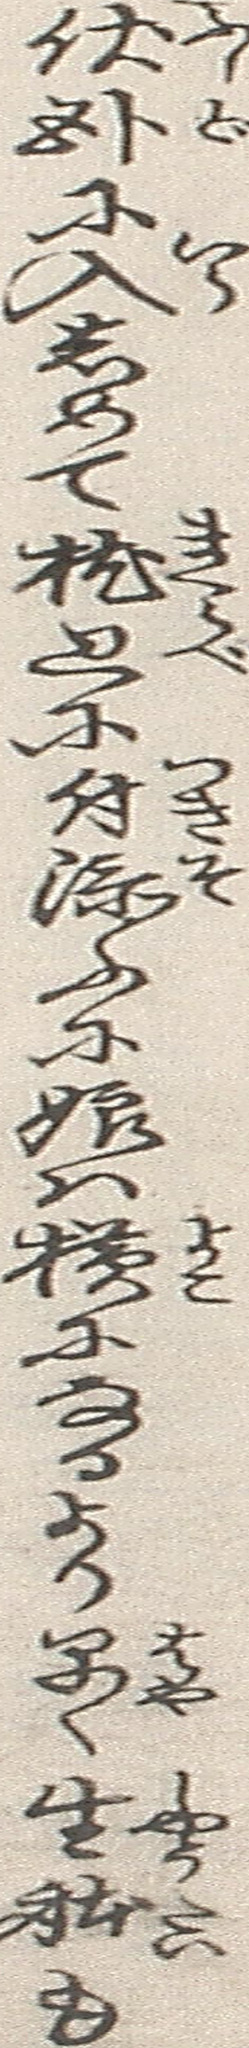伏臥に入しめて枕辺に付添ふに娘ハ横になるより早く生体も
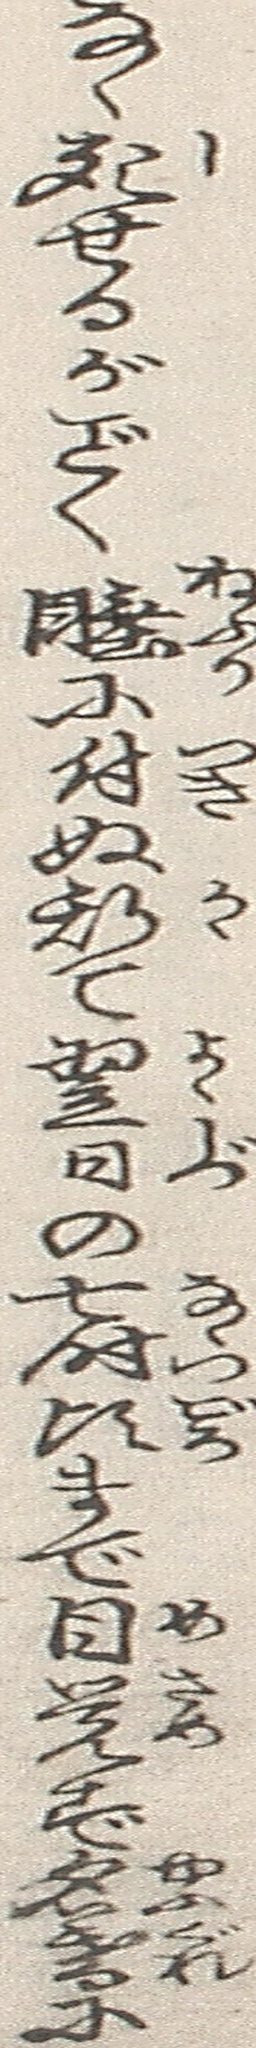なく死せるがごとく睡に付ぬ斯て翌日の七時頃まで目覚ず夕暮に
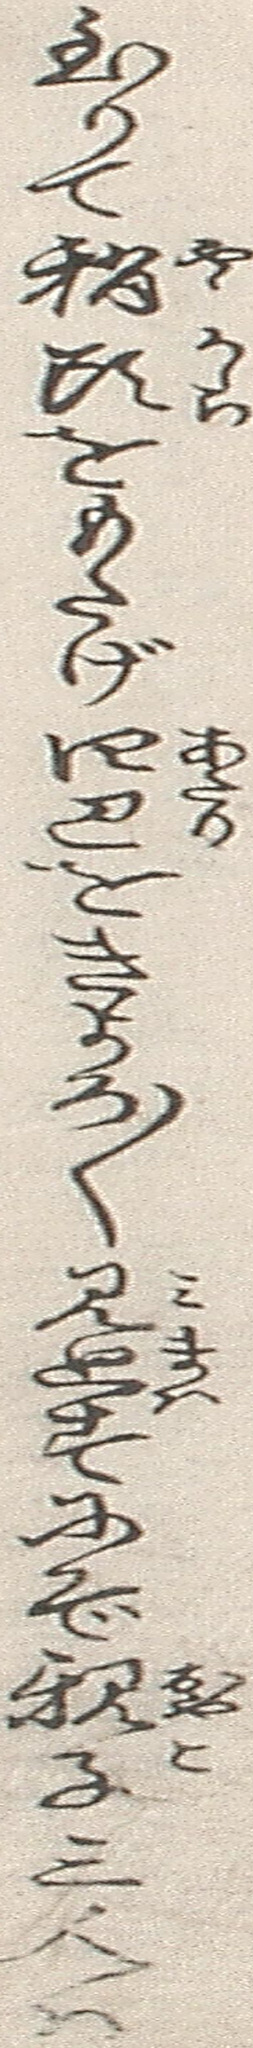至りて稍頭をもたげ四方をきよろ〳〵見廻すにぞ親子三人ハ
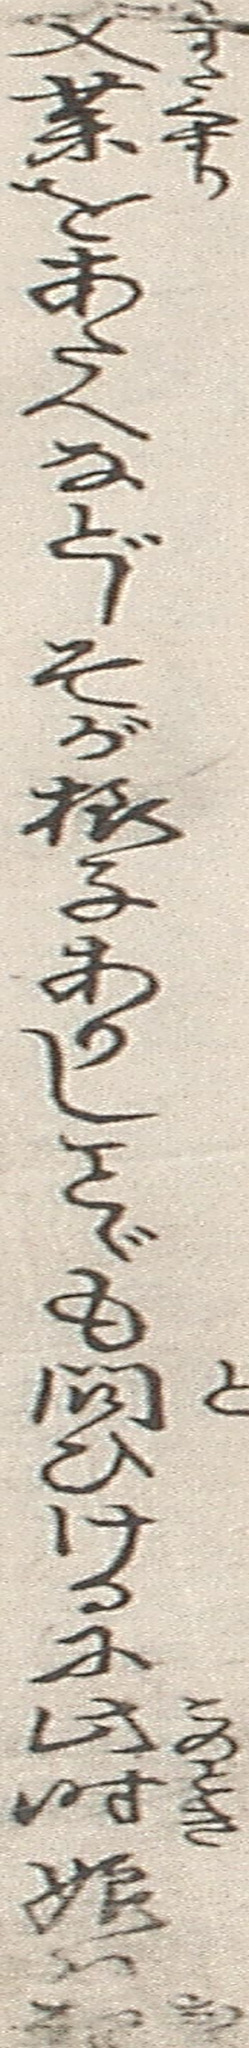又薬をあたへなどしそが様子ありしことゞも問ひけるに此時娘ハ起
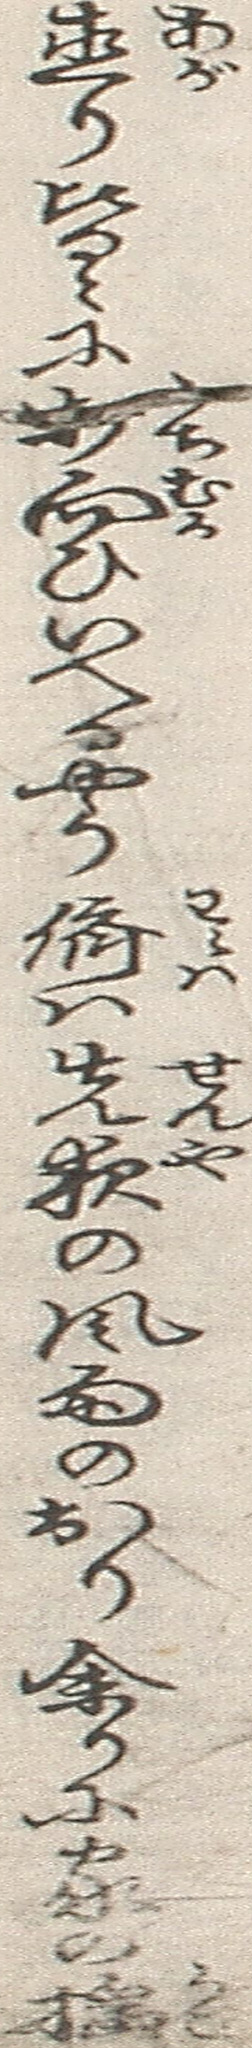直り皆々に打向ひいへるやう儕ハ先夜の風雨のおり余りに家の揺
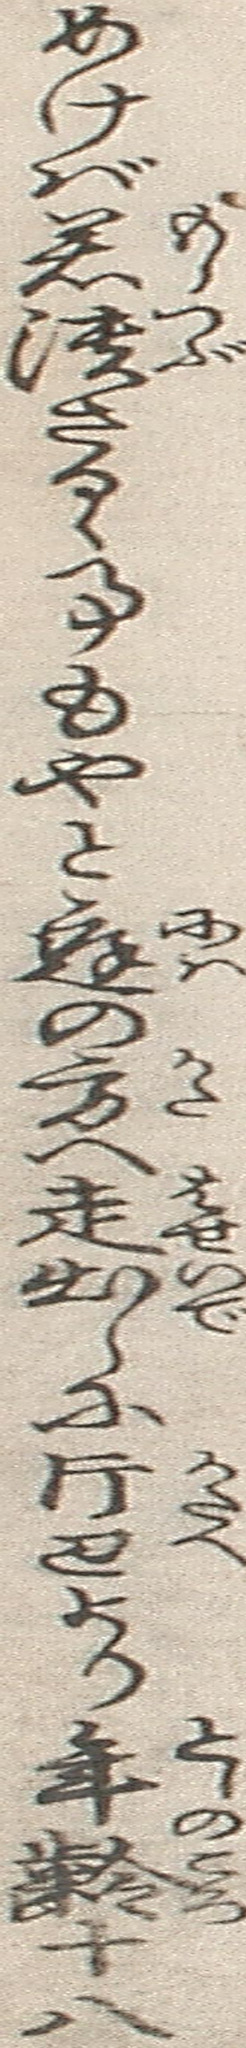めけバ若潰さるゝ事もやと庭の方へ走出しに片辺より年齢十八

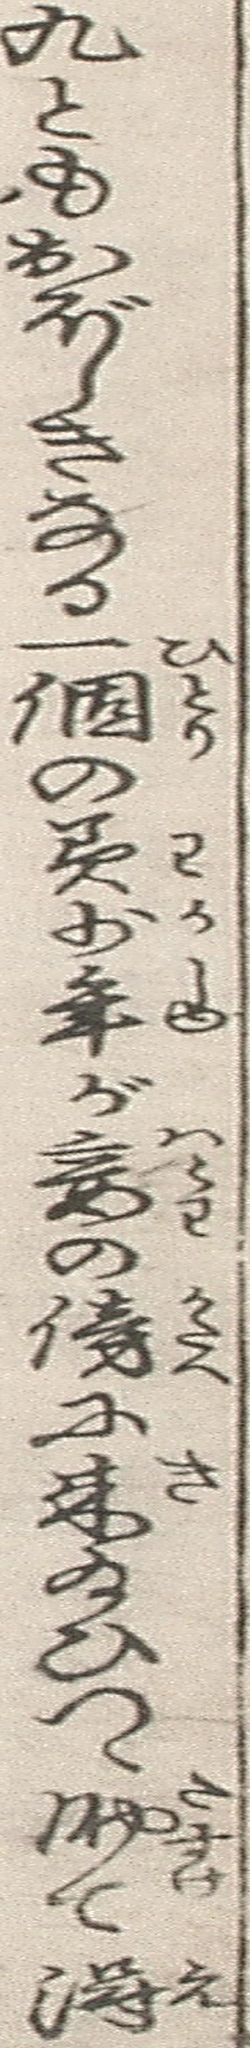九ともおぼしきなる一個の美少年が妾の傍に来給ひつゝ助て得
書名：安政風聞集　上中下　全
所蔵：東京大学地震研究所図書室 Earthquake Research Institute Library, The University of Tokyo, JAPAN
